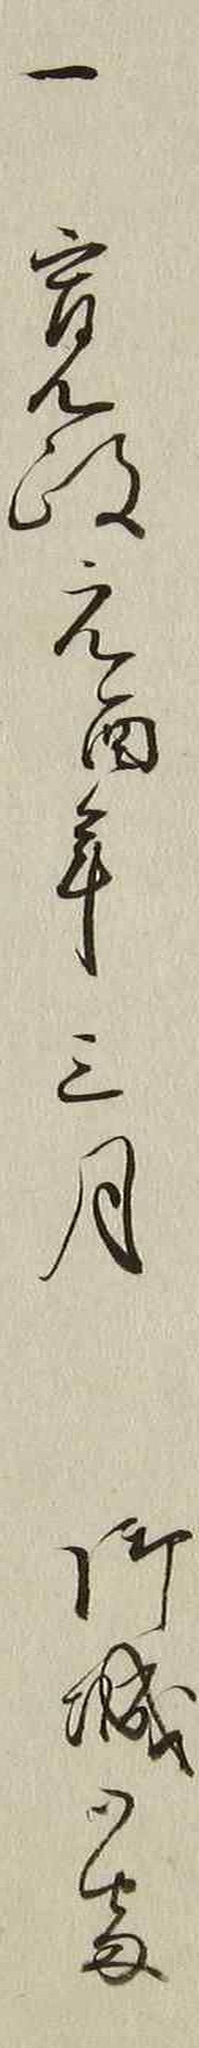一寛政元酉年三月御城御番
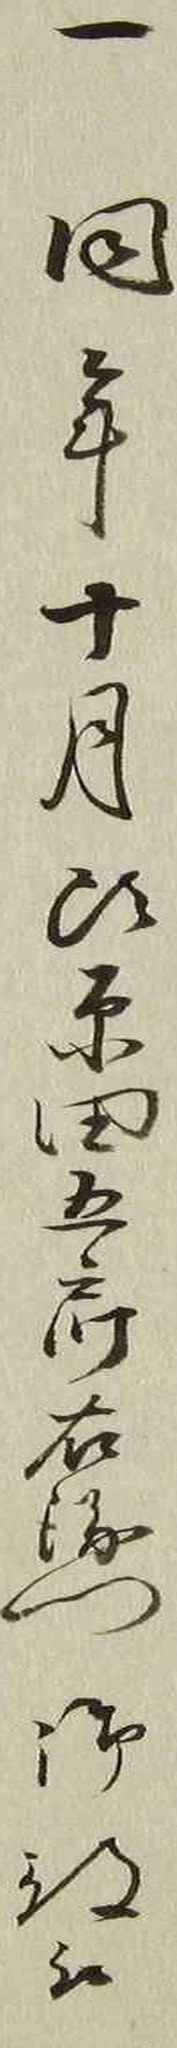一同年十月頃原田五郎右衛門御役
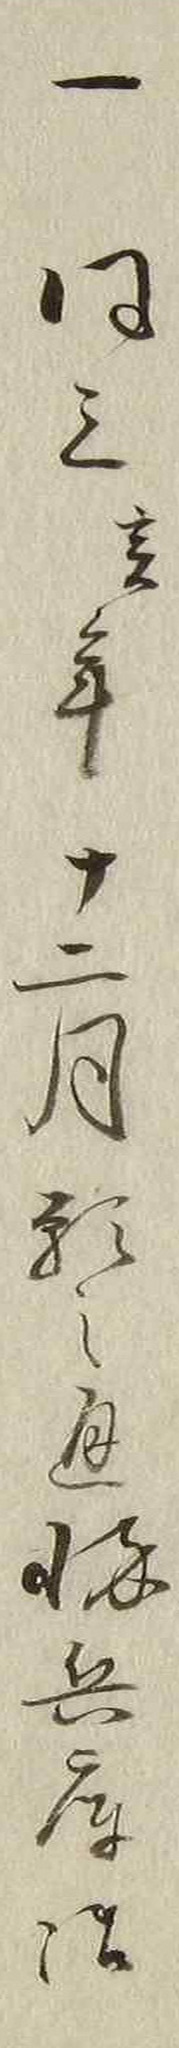一同三亥年十二月願い之通り倅兵庫御
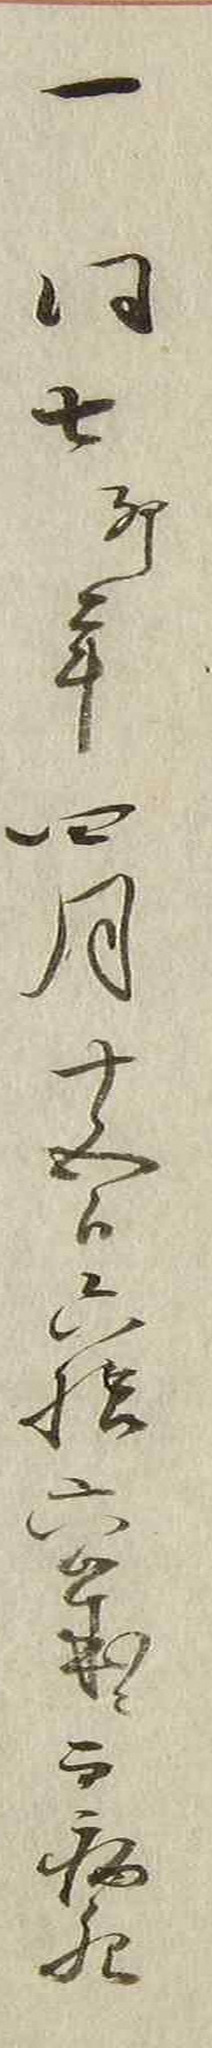一同七卯年四月十五日六拾六歳ニて病死
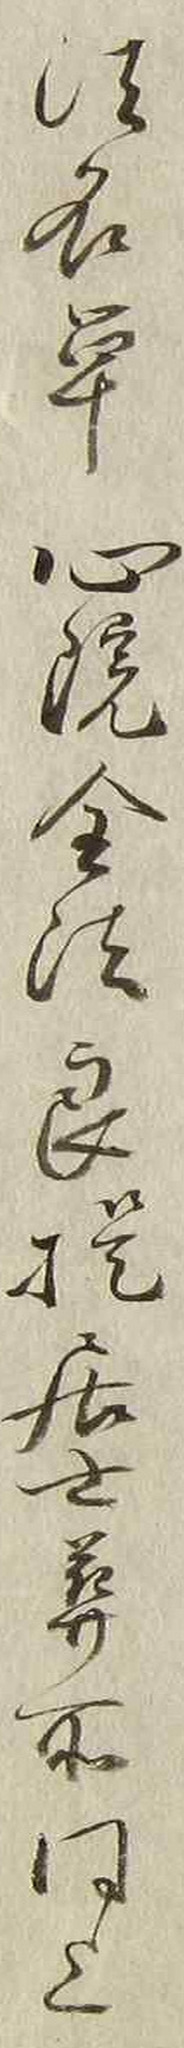法名単心院全法良提居士葬所同上
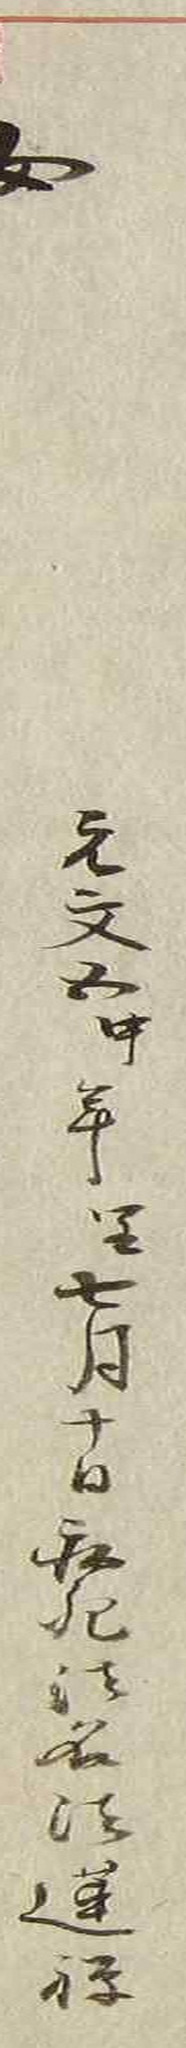元文五申年閏七月十日病死法名法蓮禅
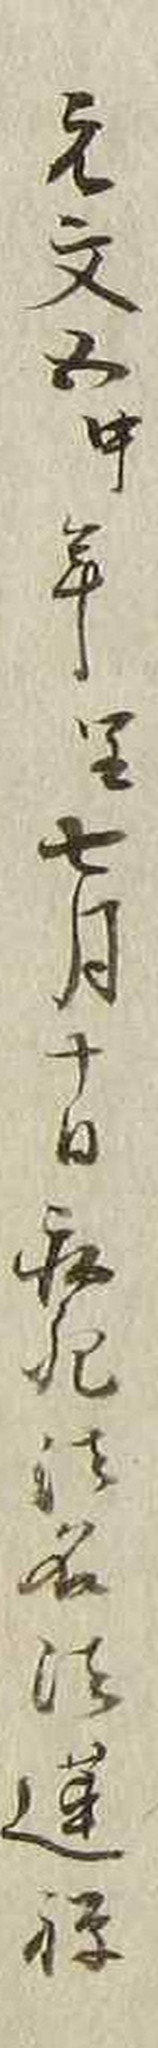元文五申年閏七月十日病死法名法蓮禅
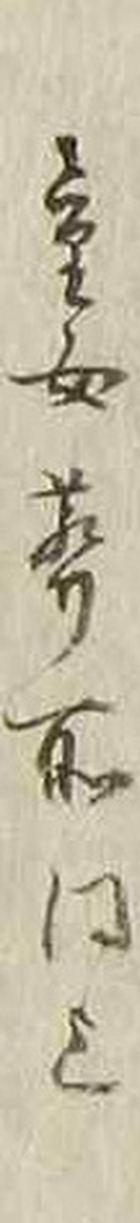童女葬所同上

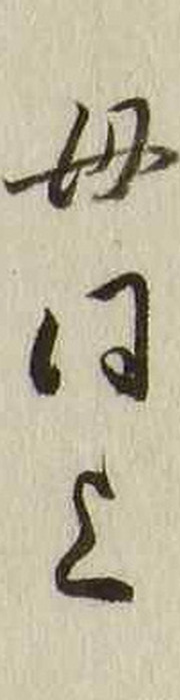母同上
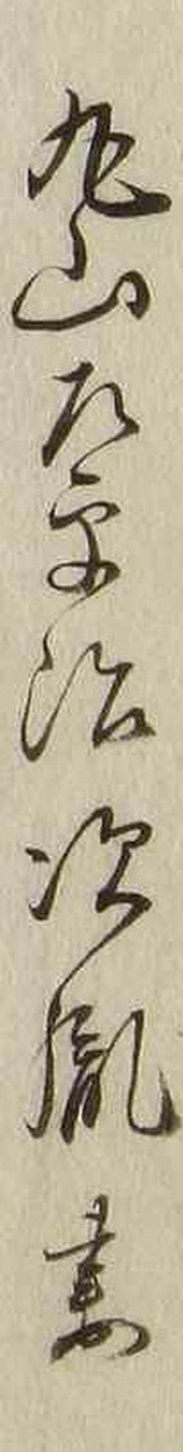女丸山左京治次胤
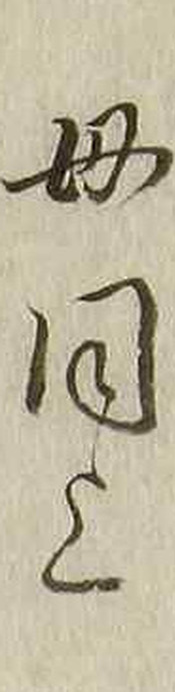母同上
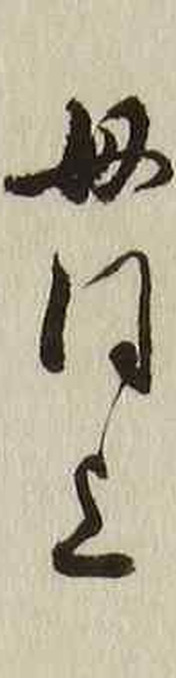母同上
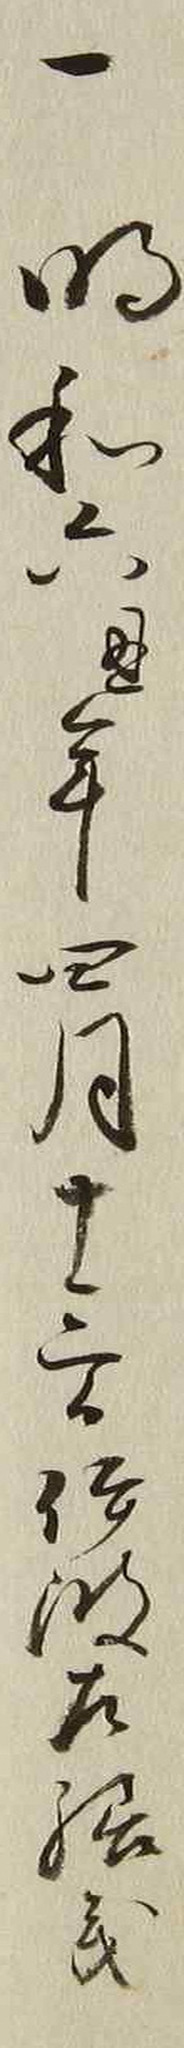一明和六丑年四月十三日伊波さ左膳義
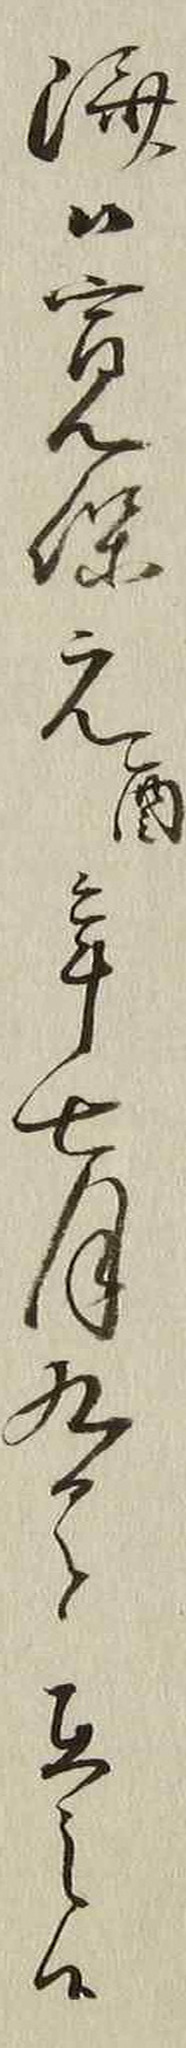済候寛保元酉年七月九日とこれ在り候
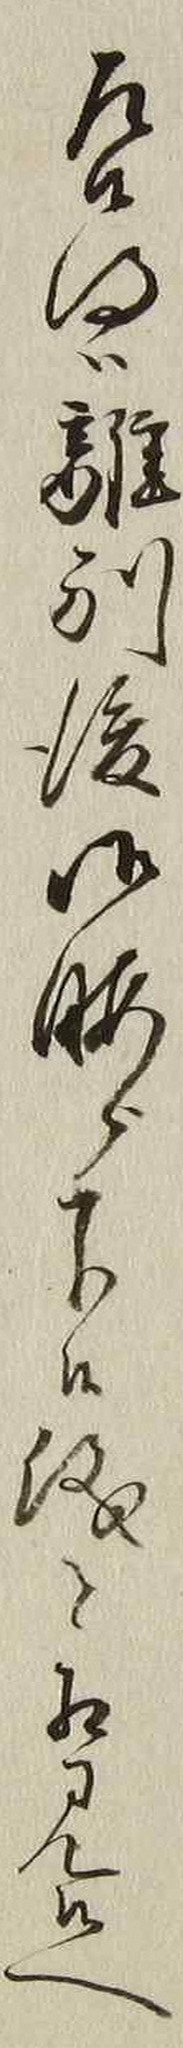左候得バ離別後御暇下され候儀と相見え候へ
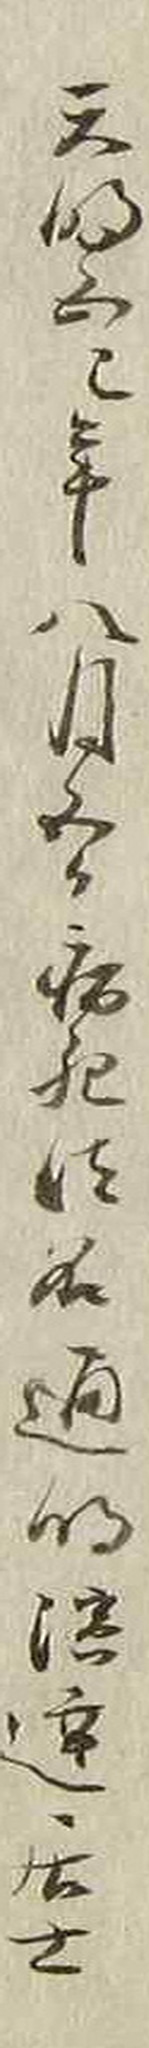天明五巳年八月五日病死法名通明演達居士
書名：諸士系譜　巻之20　い之部20
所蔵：会津若松市立会津図書館
